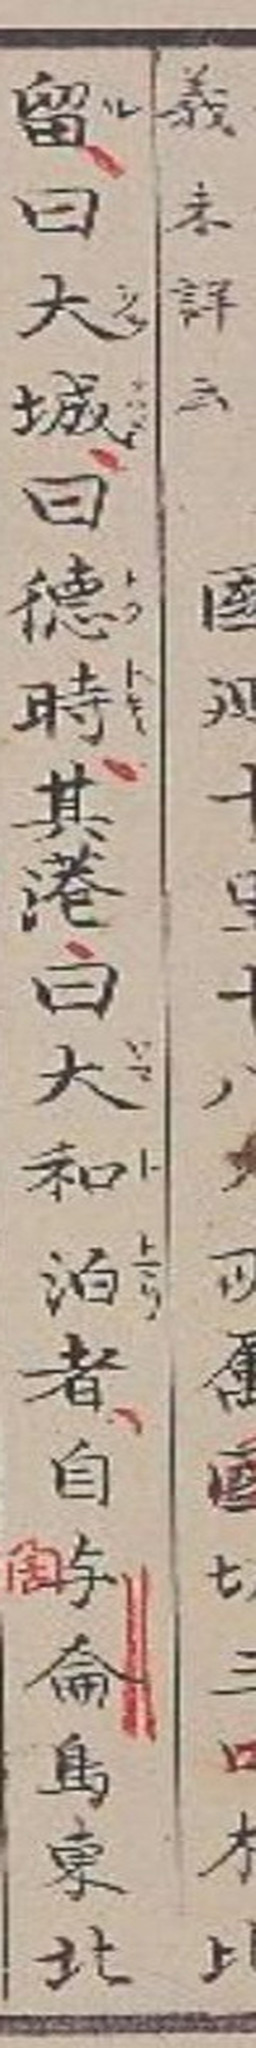留、曰大城、曰徳時、其港、曰大和泊者、自与侖島東北
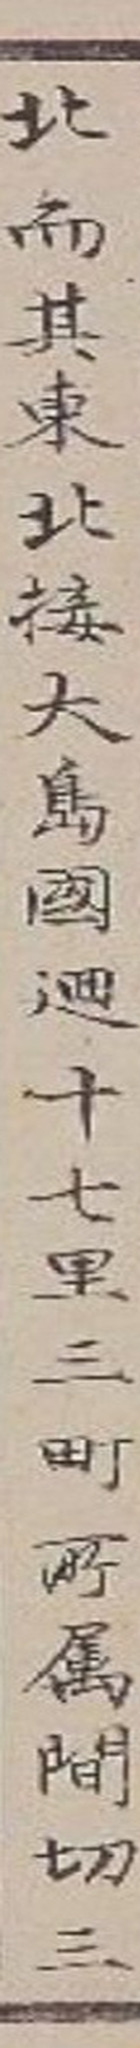北而其東北接大島国廻十七里三町所属間切三
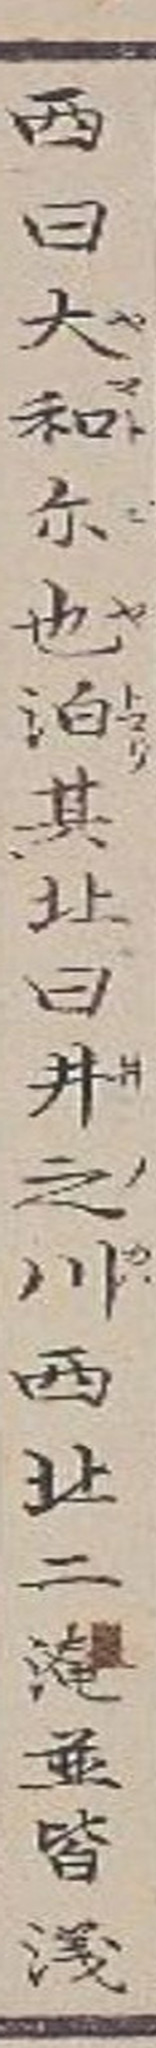西曰大和尓也泊其北曰井之川西北二淹並皆浅
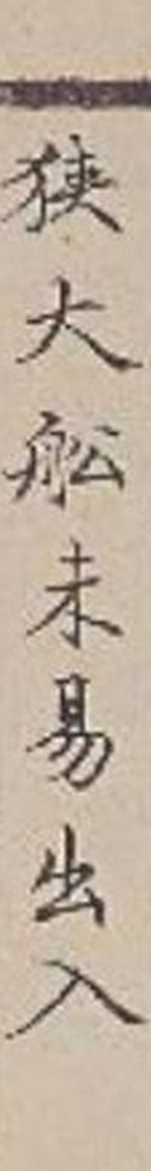狭大船未易出入
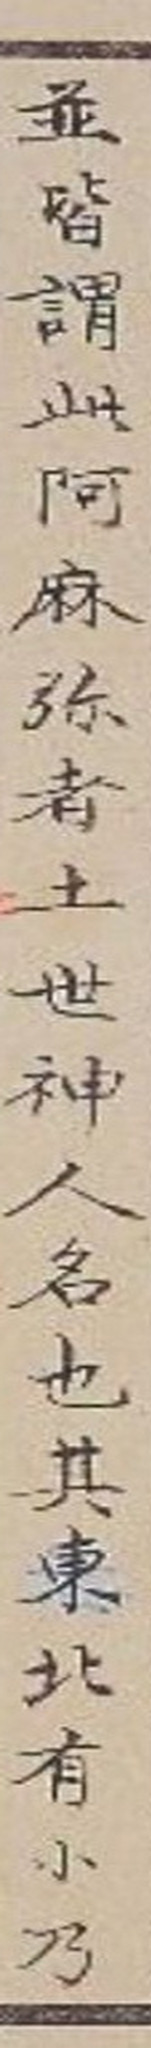並皆謂此阿麻弥者土上世神人名也其東北有小乃
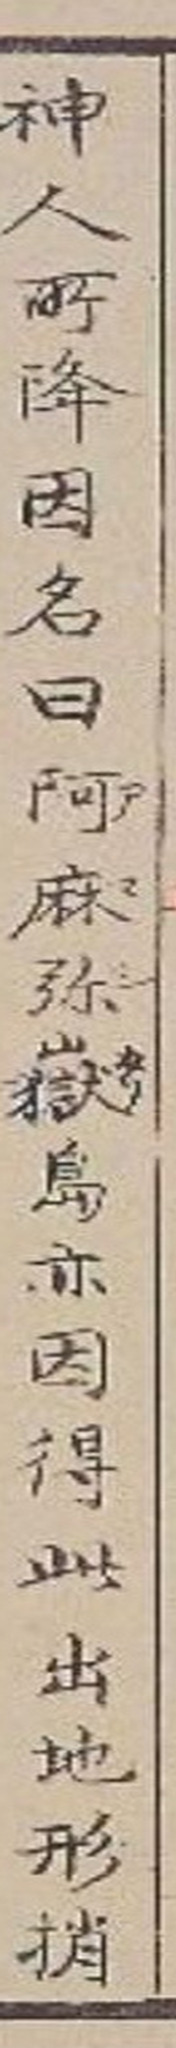神人所降因名曰阿麻弥岳島亦因得此出地形捎

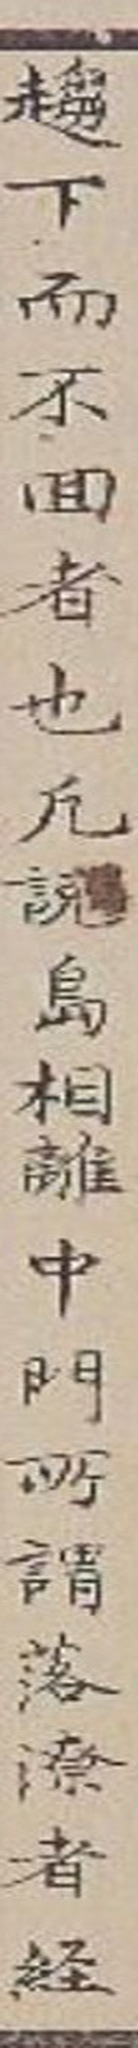趨下而不回者也凡説島相離中門所謂落潦者経
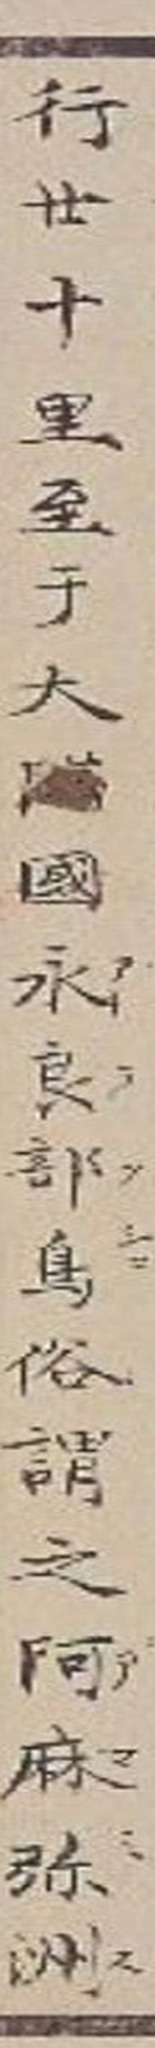行廿十里至于大隅国永良部島俗謂之阿麻弥洲
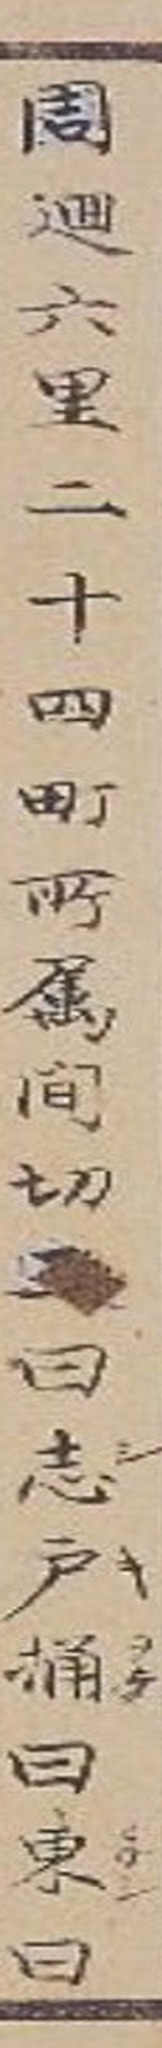周廻六里二十四町所属間切曰志戸桶曰東曰
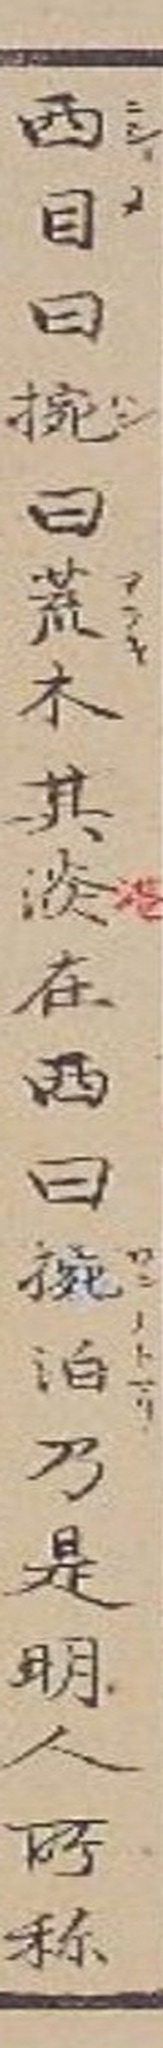西目曰椀曰荒木其淡港在西曰椀泊乃是明人所称
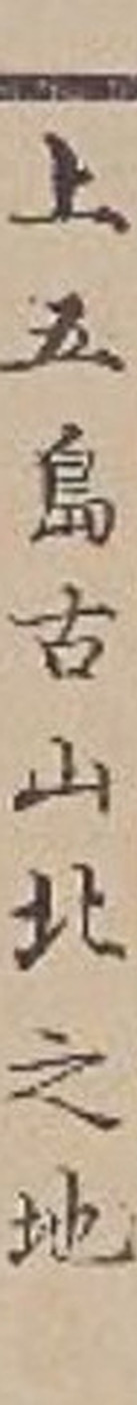上五島古山北之地
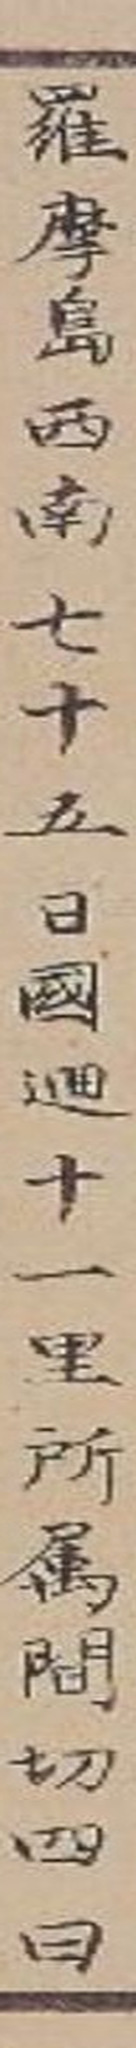羅摩島西南七十五日国廻十一里所属間切四曰

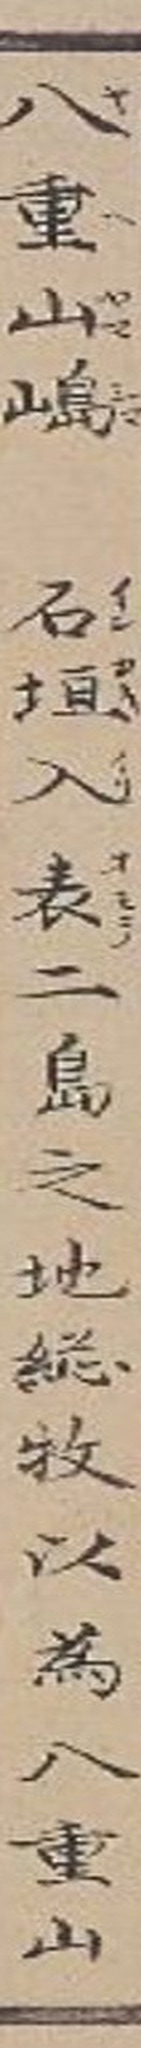八重山島石垣入表二島之地総牧以為八重山
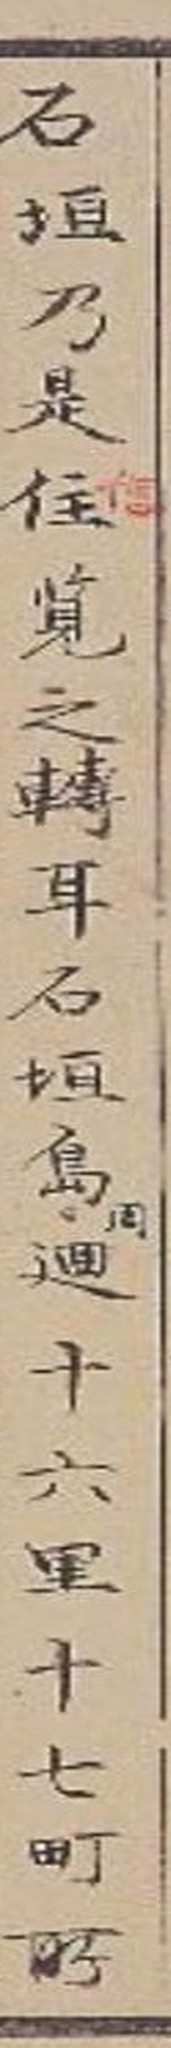石垣乃是住信覧之転耳石垣島周廻十六里十七町所
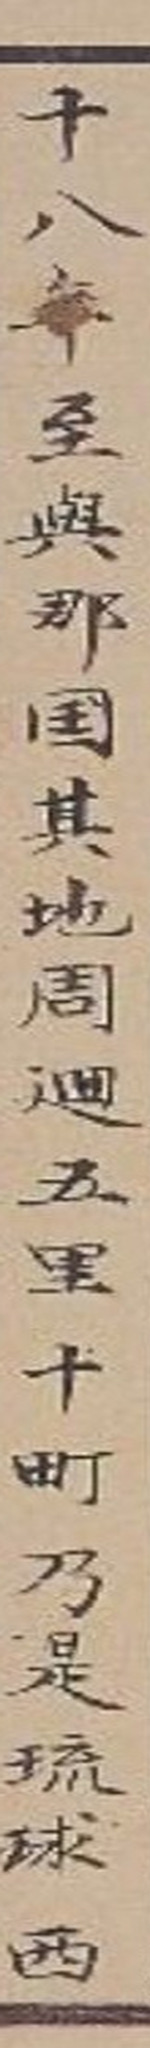十八至与那国其地周廻五里十町乃是琉球西

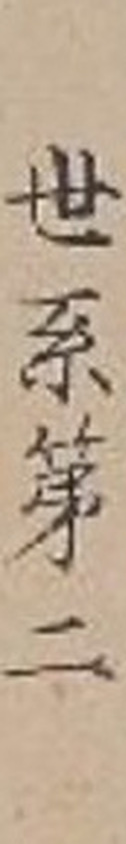世系第二
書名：南島志 全
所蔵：University of the Ryukyus Library
